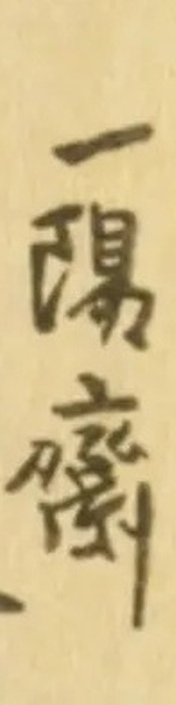一陽斎
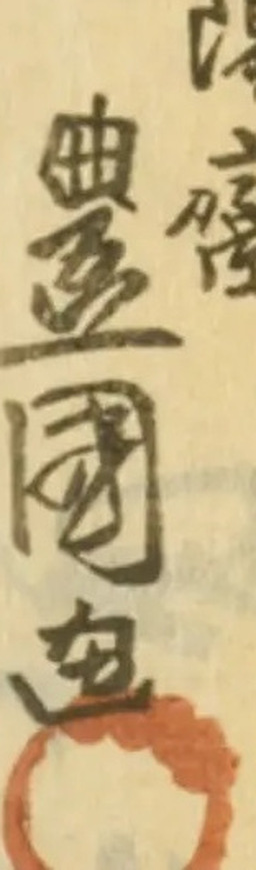豊国画
